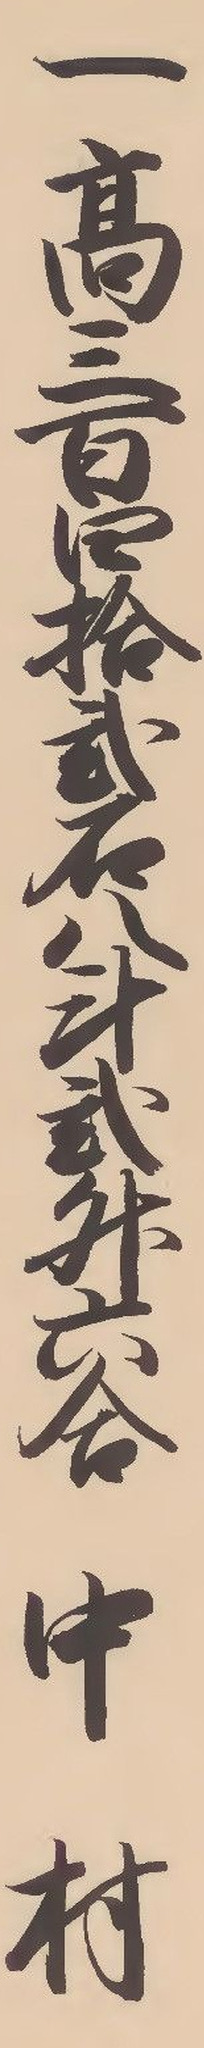一高三百四拾弐石八斗弐升六合中村
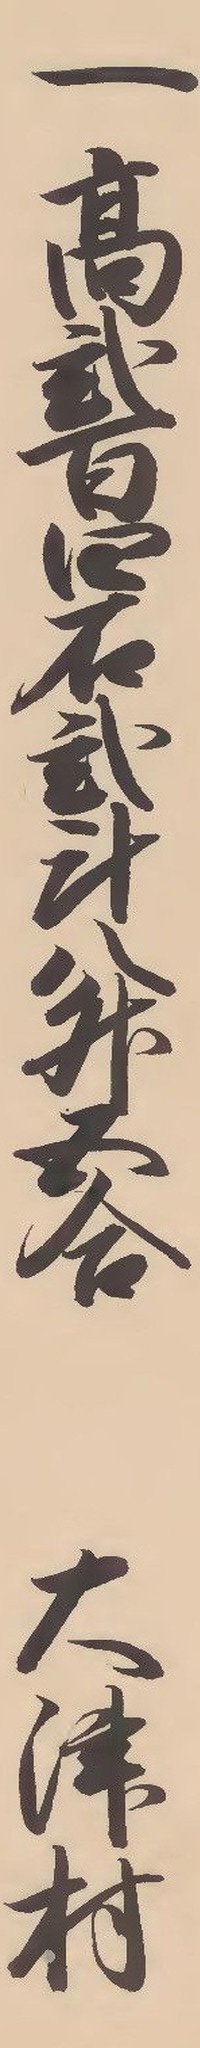一高弐百四石弐斗八升五合大津村
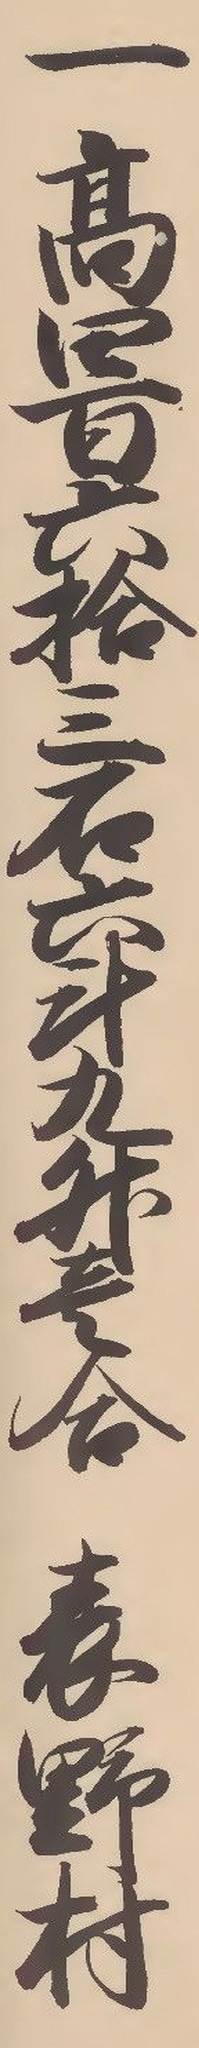一高四百六拾三石六斗九升壱合表野村
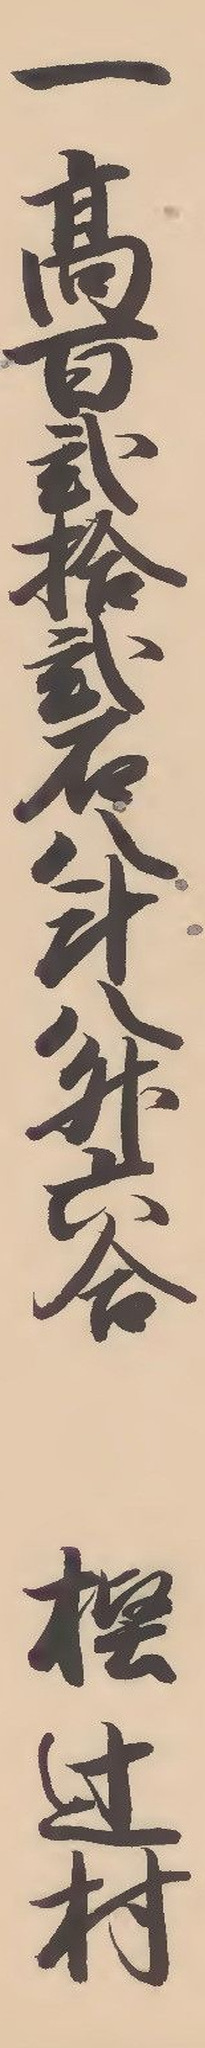一高百弐拾弐石八斗八升六合樫辻村

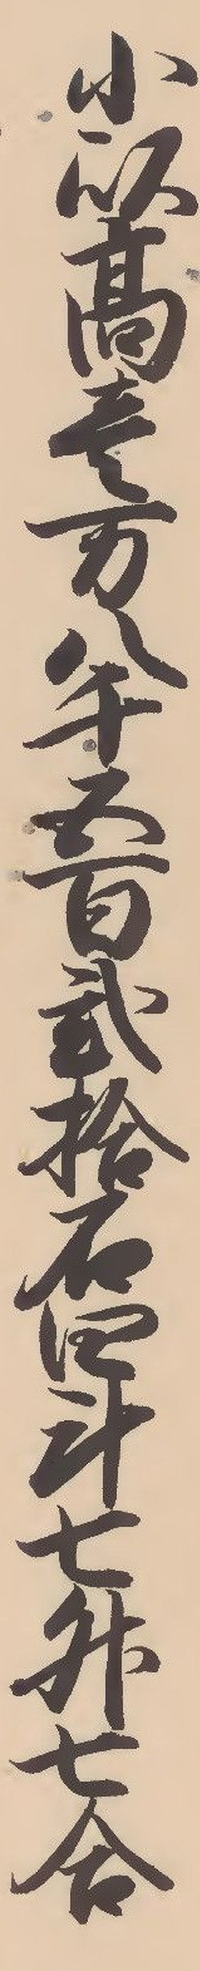小以高壱万八千五百弐拾石四斗七升七合
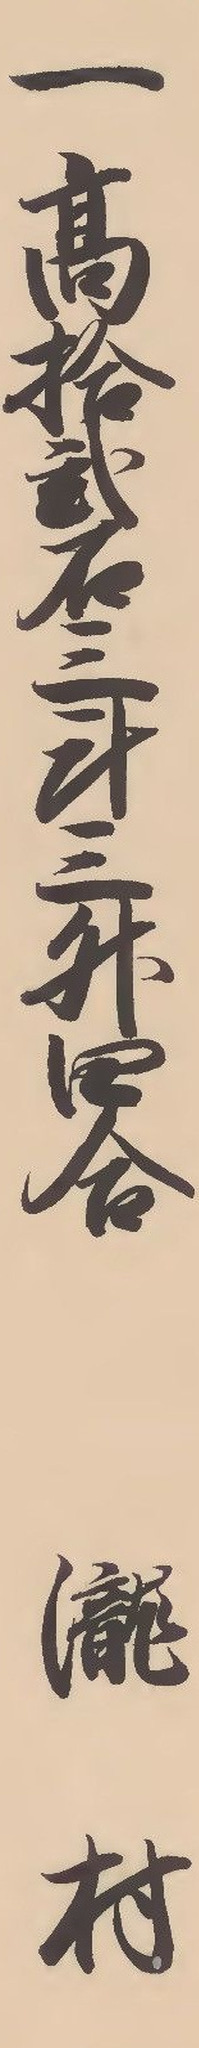一高拾弐石三斗三升四合滝村
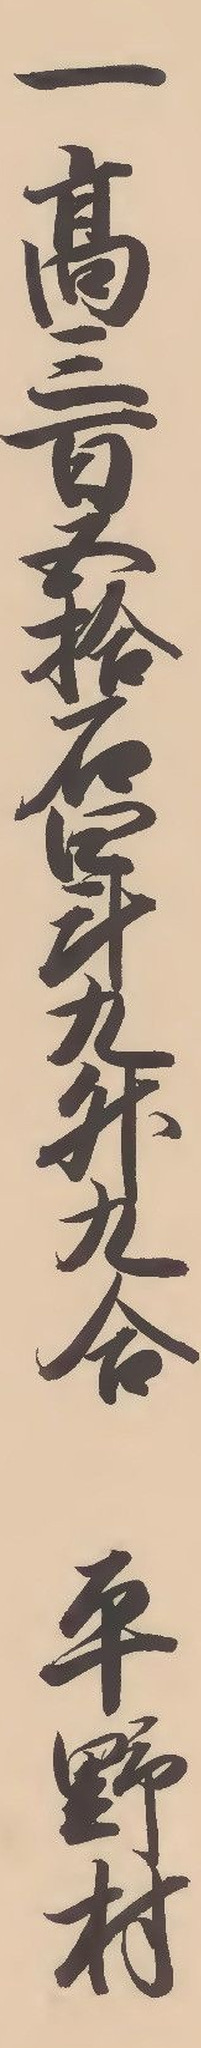一高三百五拾石四斗九升九合平野村
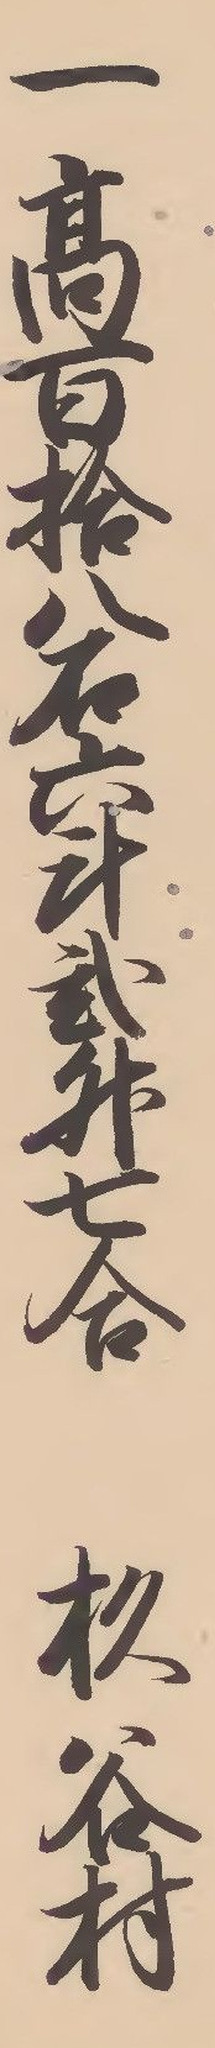一高百拾八石六斗弐升七合杉谷村

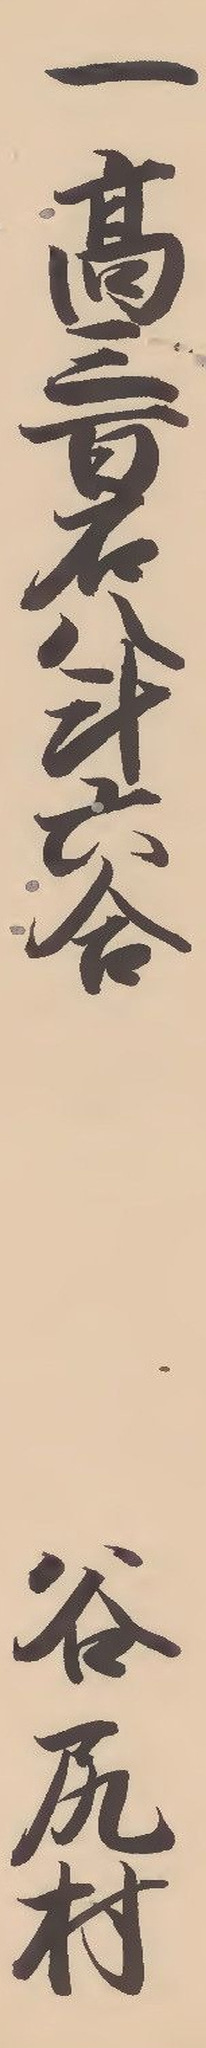一高三百石八斗六合谷尻村
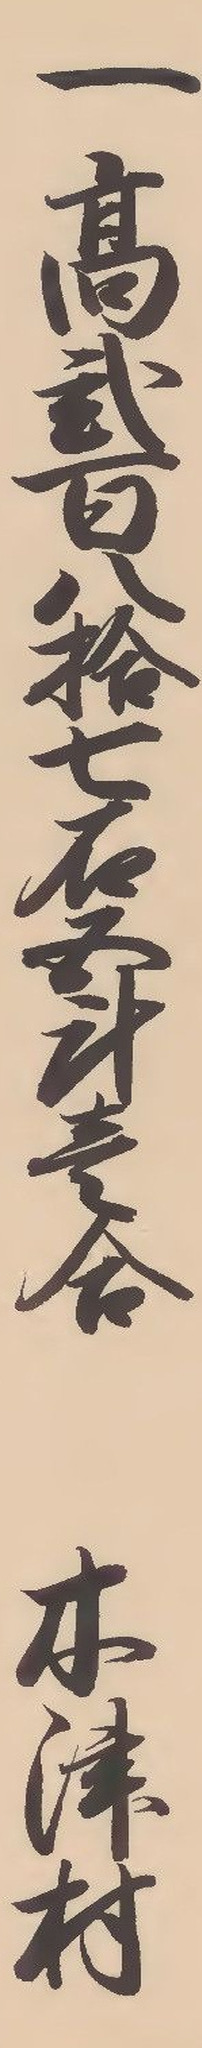一高弐百八拾七石五斗壱合木津村
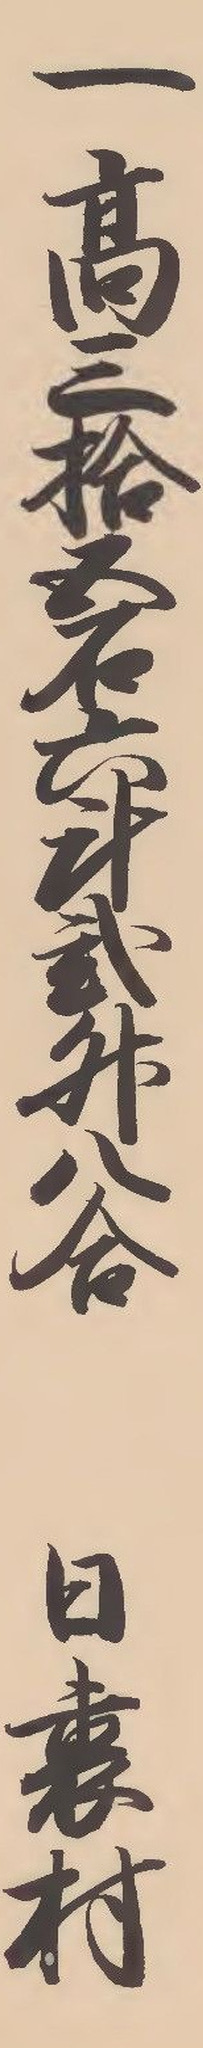一高三拾五石六斗弐升八合日裏村
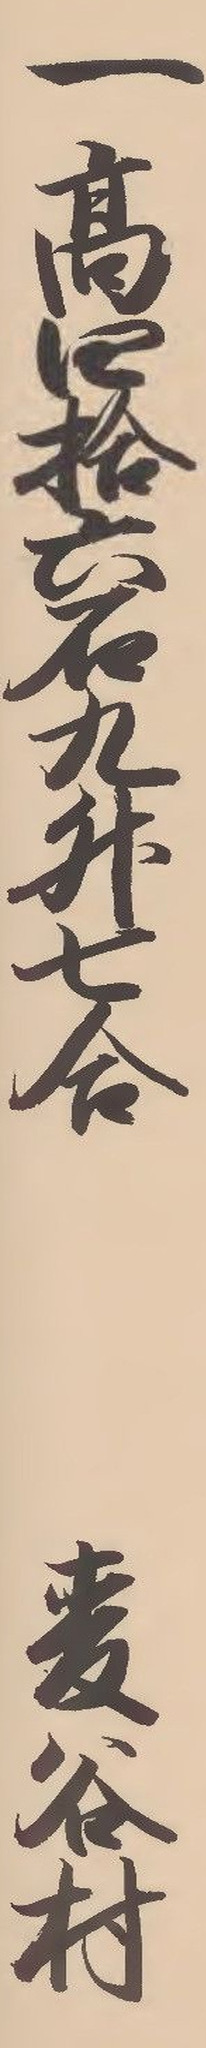一高四拾六石九升七合麦谷村
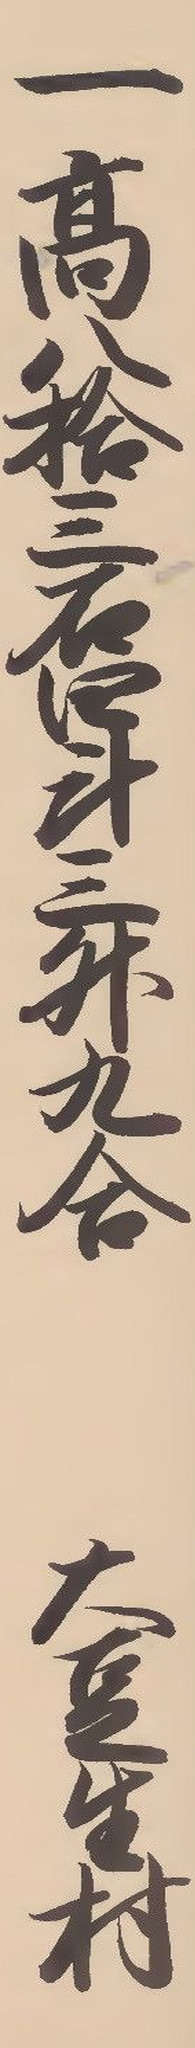一高八拾三石四斗三升九合大豆生村
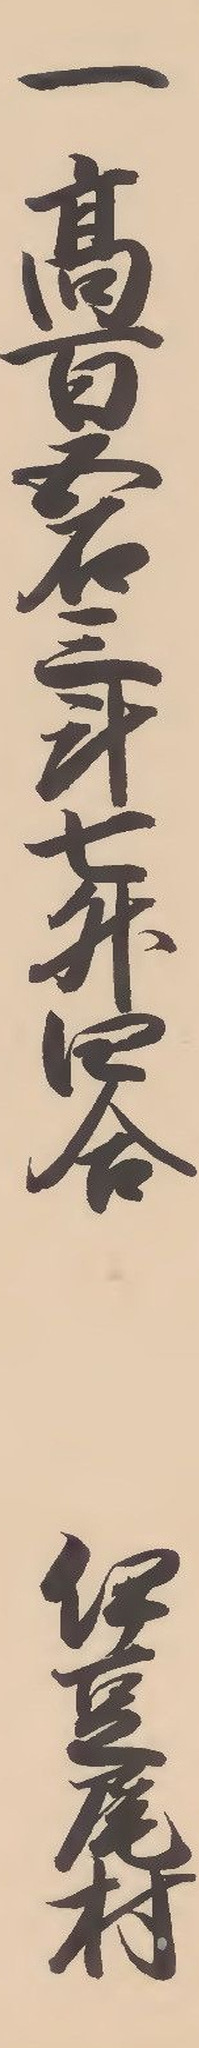一高百五石三斗七升四合伊豆尾村
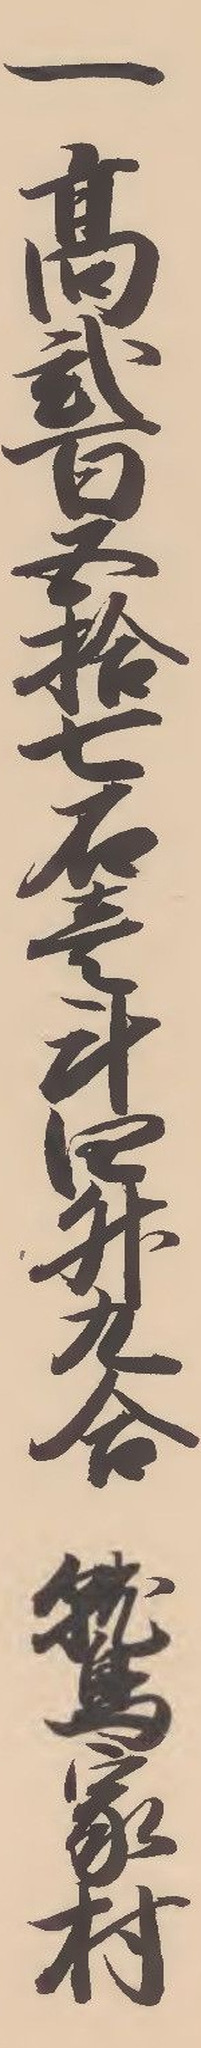一高弐百五拾七石壱斗四升九合鷲家村
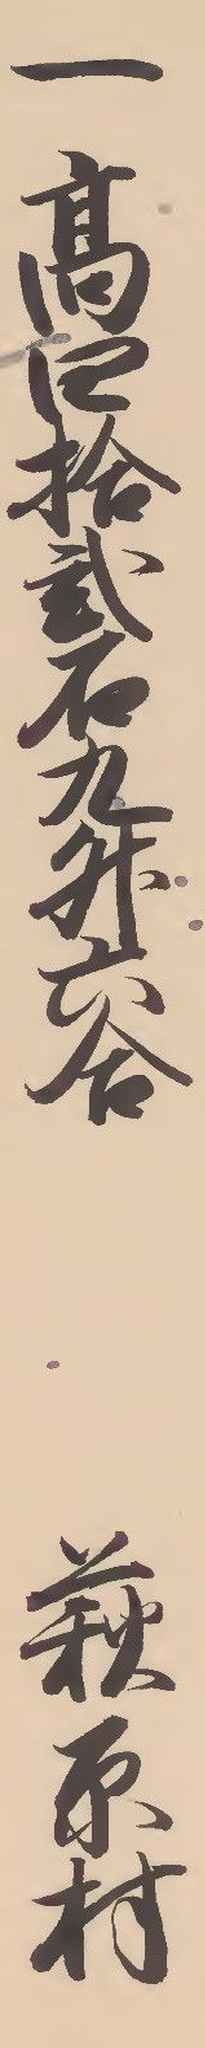一高四拾弐石九升六合萩原村
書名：大和国郷帳
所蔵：国立公文書館 National Archives of Japan
